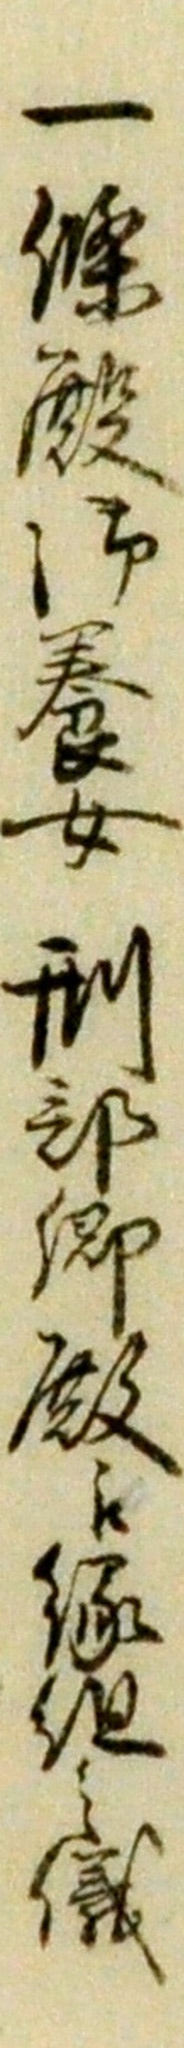一條殿御養女刑部卿殿え縁組之儀
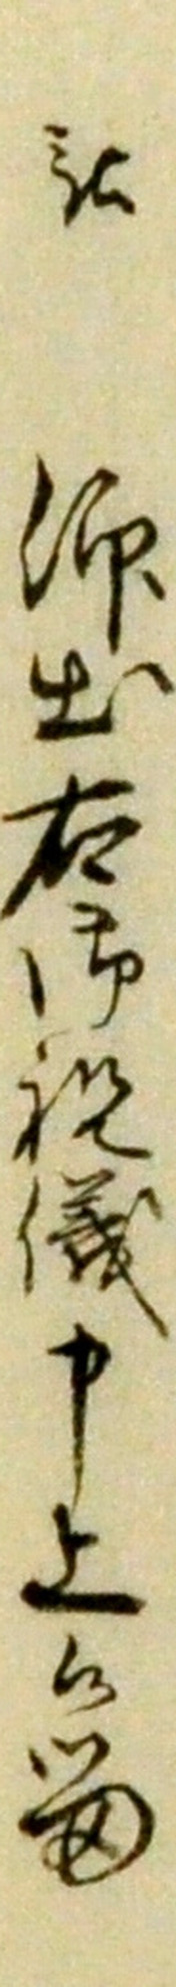被仰出右御祝儀申上候留

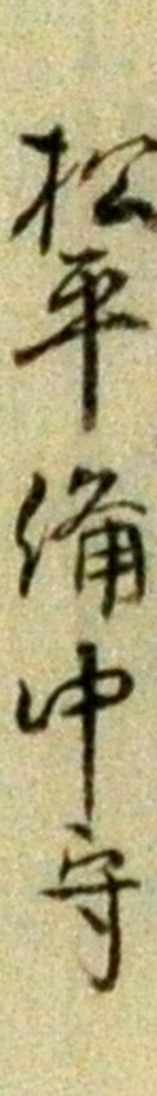松平備中守
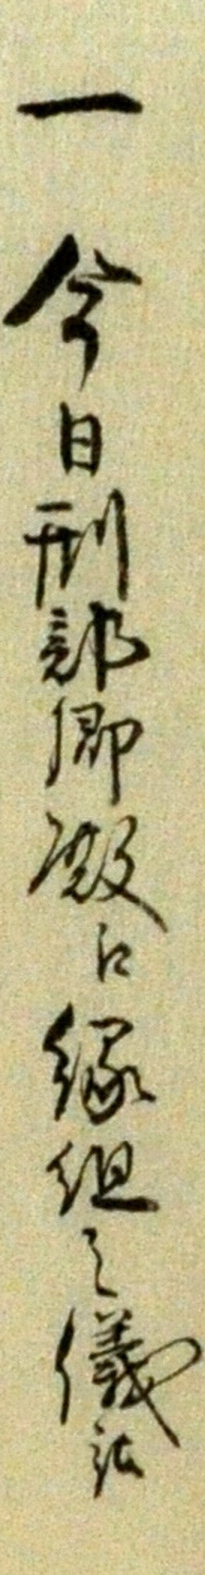一今日刑部卿殿え縁組之儀被
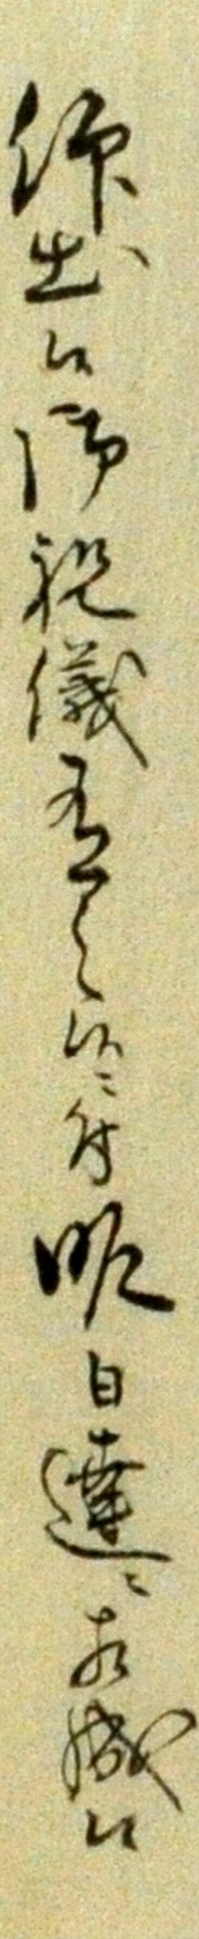仰出候御祝儀有之候ニ付昨日達ニ相成候
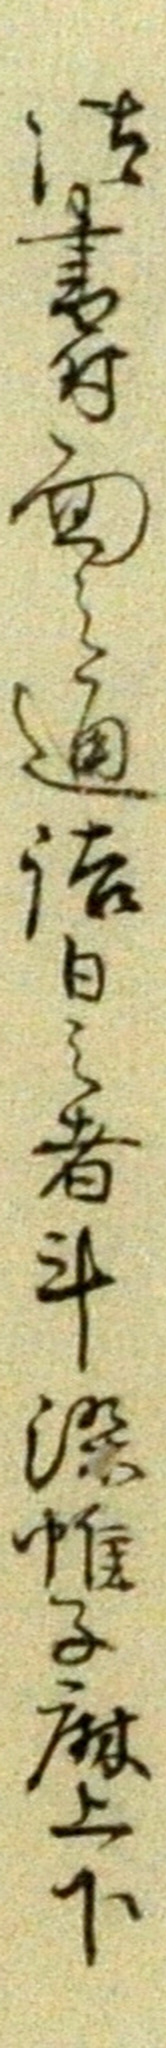御書付面之通詰日之者計染帷子麻上下
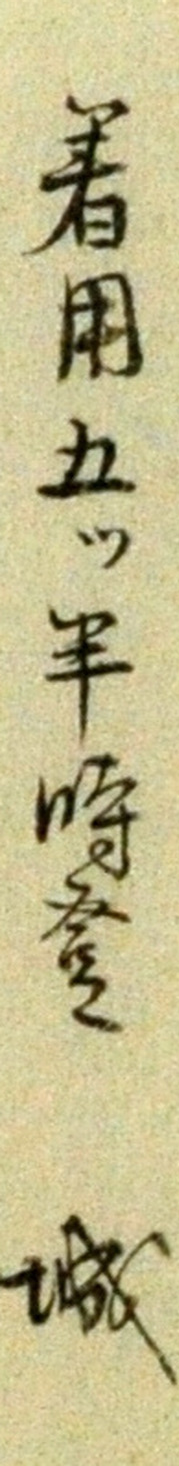着用五ツ半時登城
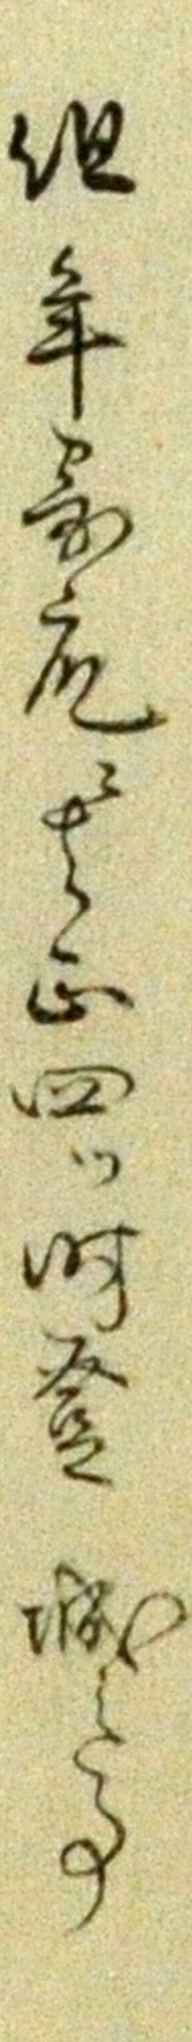但年寄衆ニは正四ツ時登城之事
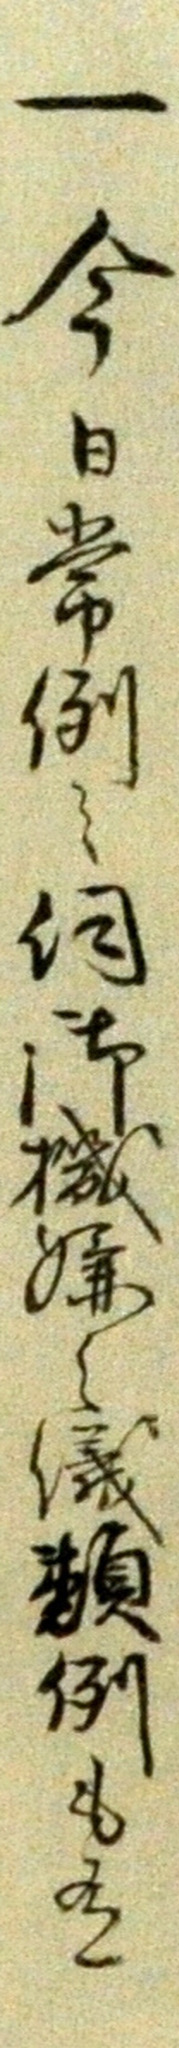一今日常例之伺御機嫌之儀類例も有
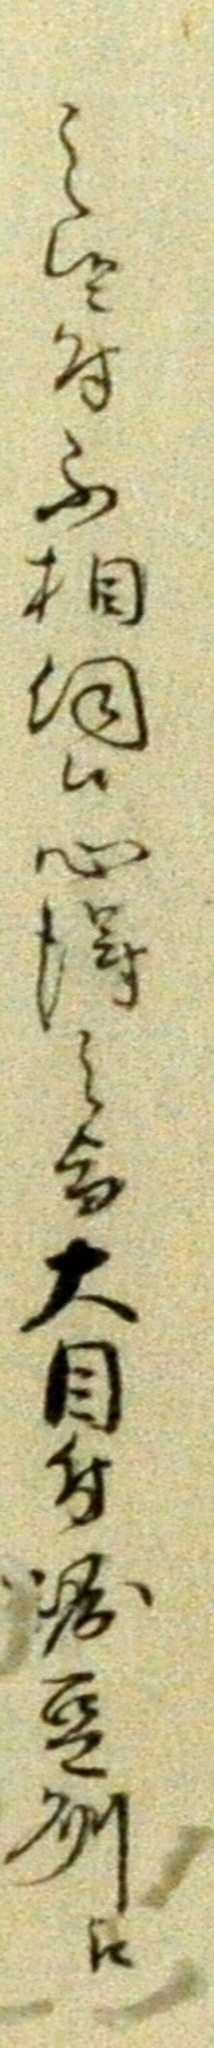之候ニ付不相伺候心得之旨大目付堀豆州え
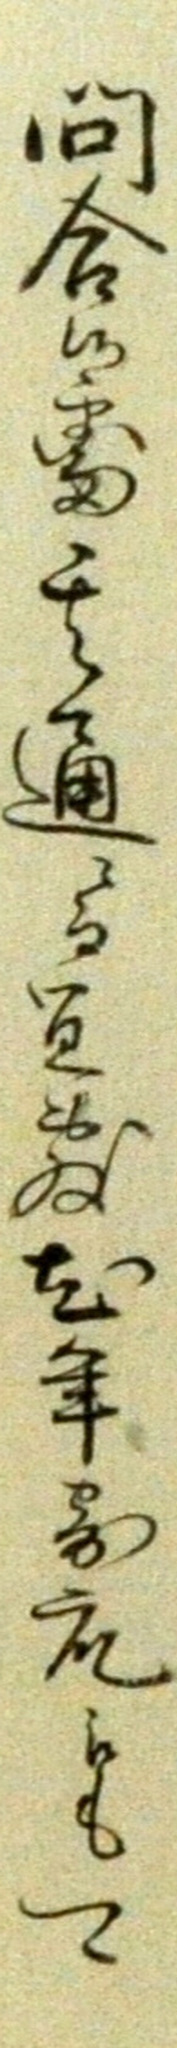問合候処其通ニ而宜敷尤年寄衆えも可
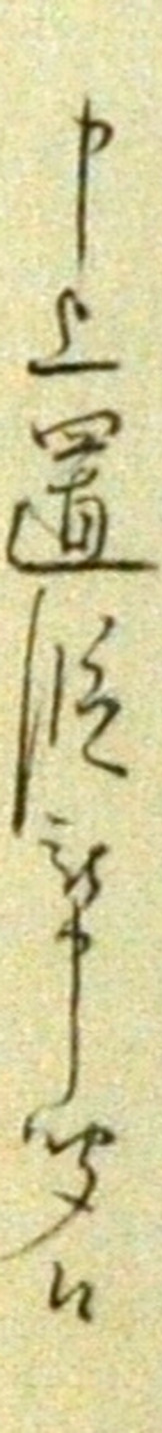申上置段被申聞候

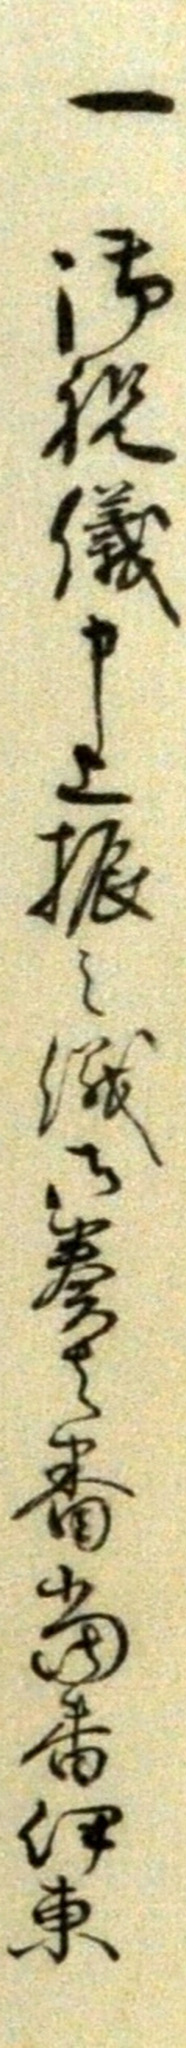一御祝儀申上振之儀御奏者番当番伊東
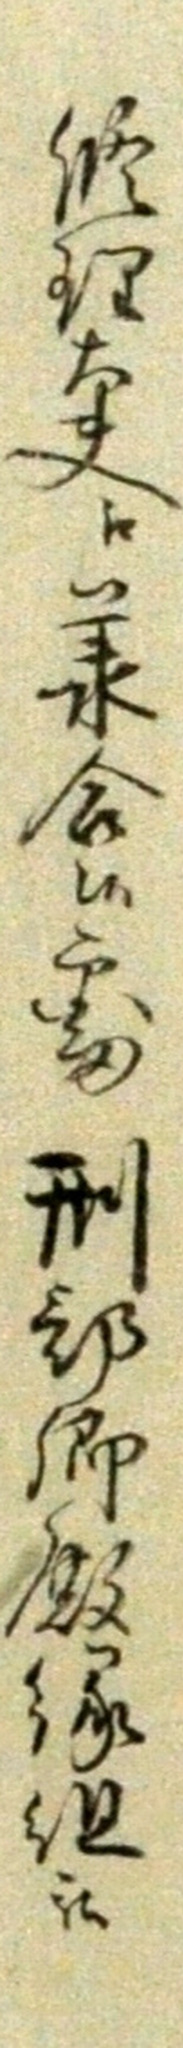修理大夫え承合候処刑部卿殿縁組被
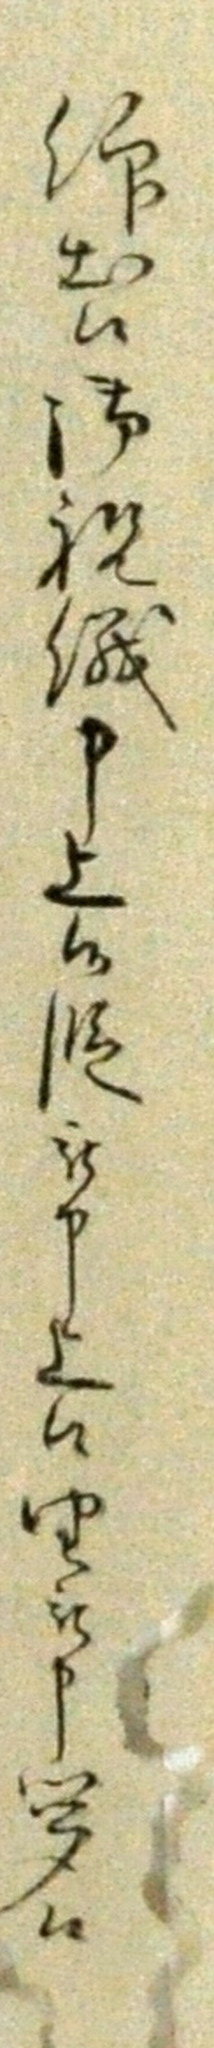仰出候御祝儀申上候段被申上候由被申聞候
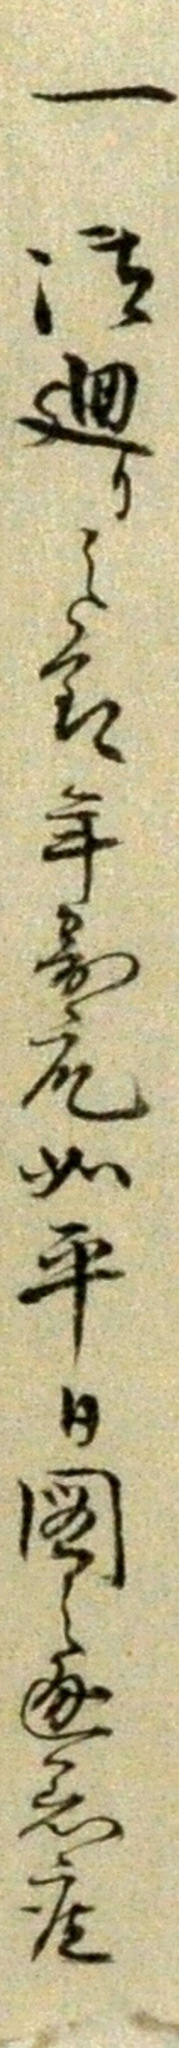一御廻り之節年寄衆如平日図之通着座
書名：諸留書〔一括〕
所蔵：伊那市立高遠町図書館・合同会社AMANE
